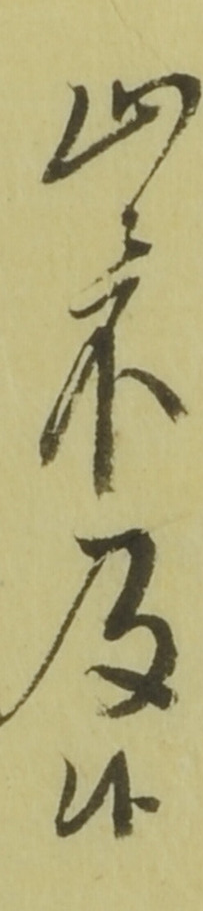止ニ不及候
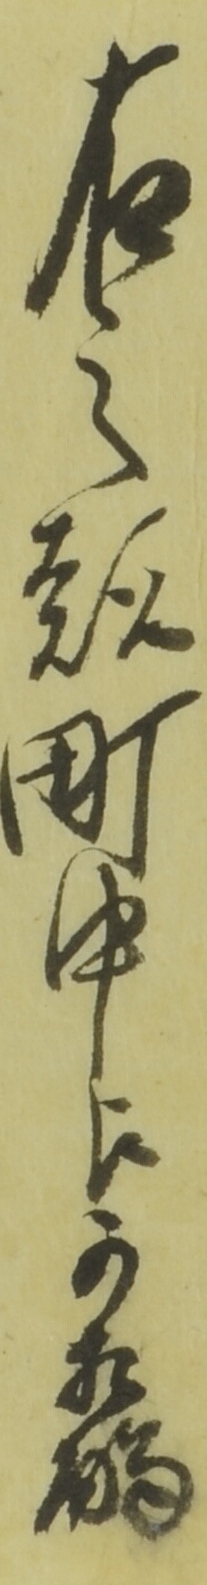右之趣町中江可相触
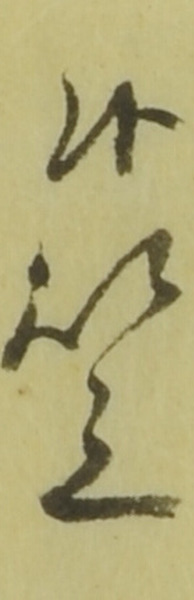候以上
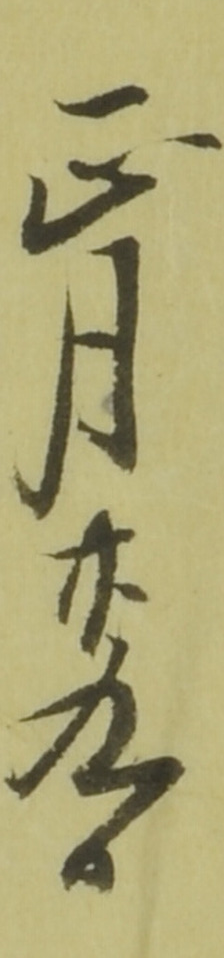正月廿九日
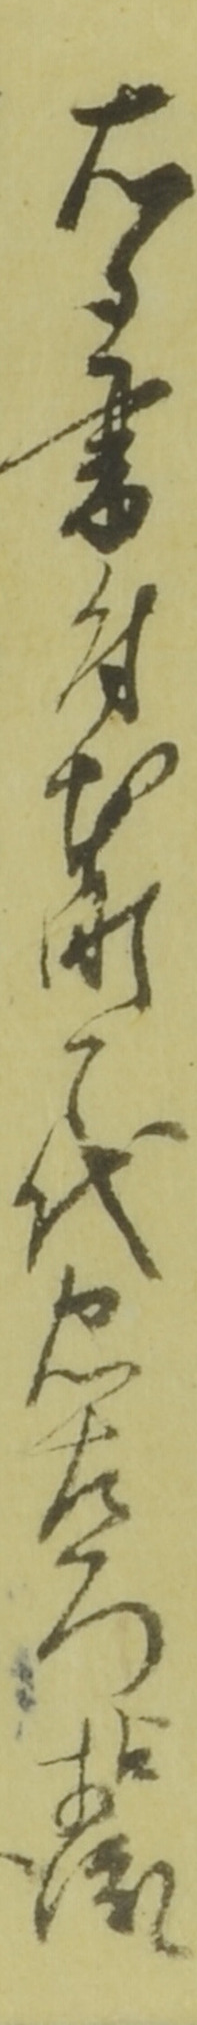右御書付本町丁代忠右衛門江相渡シ
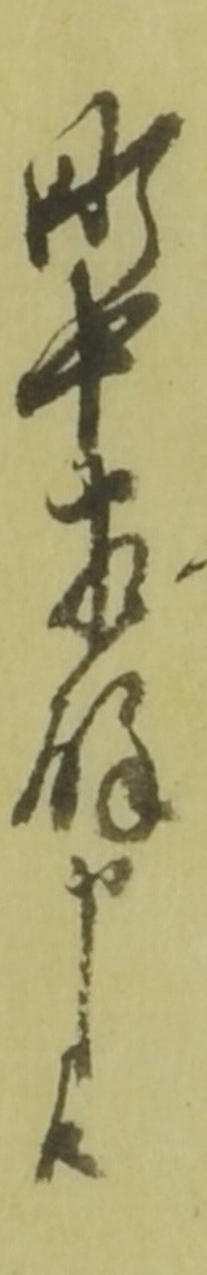町中相触申候
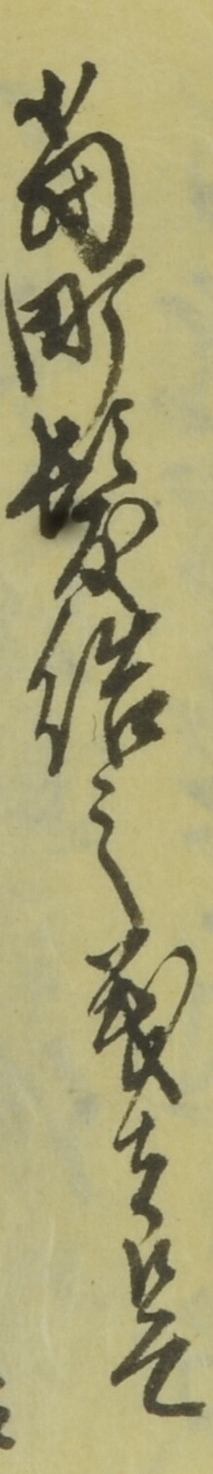当町髪結之義は是
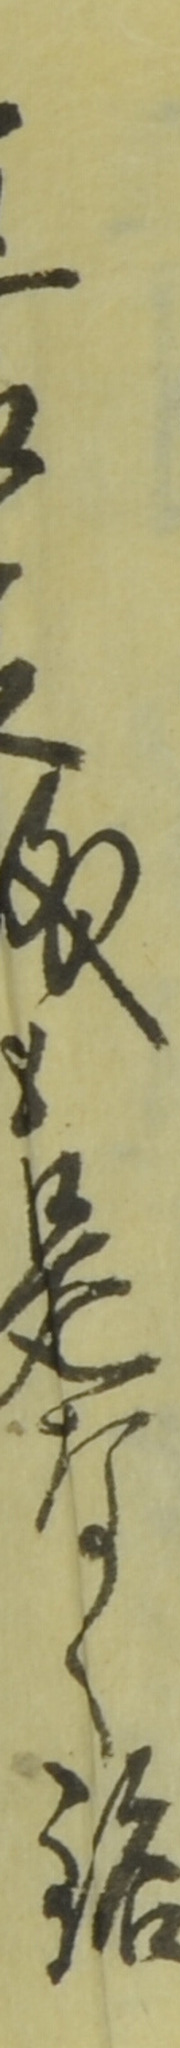迄相定儀も是なく銘

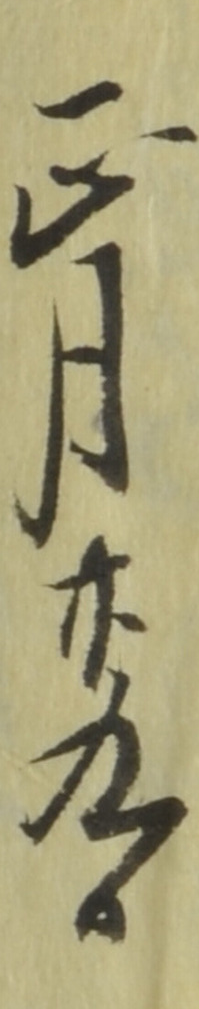正月廿九日
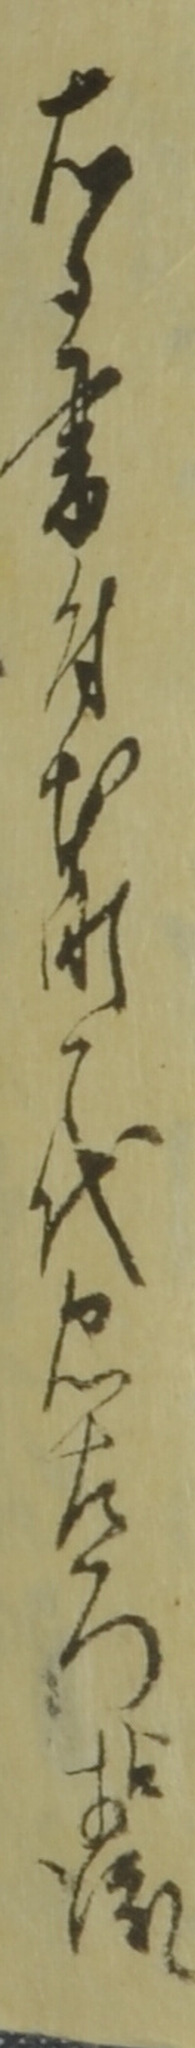右御書付本町丁代忠右衛門江相渡シ
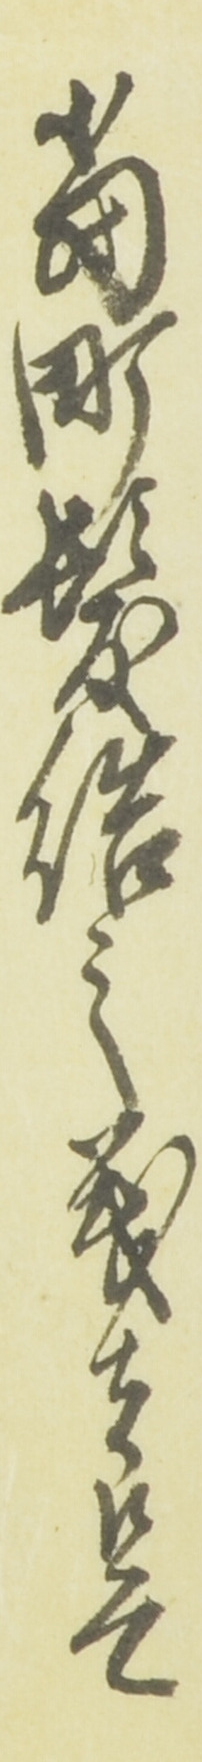当町髪結之義は是
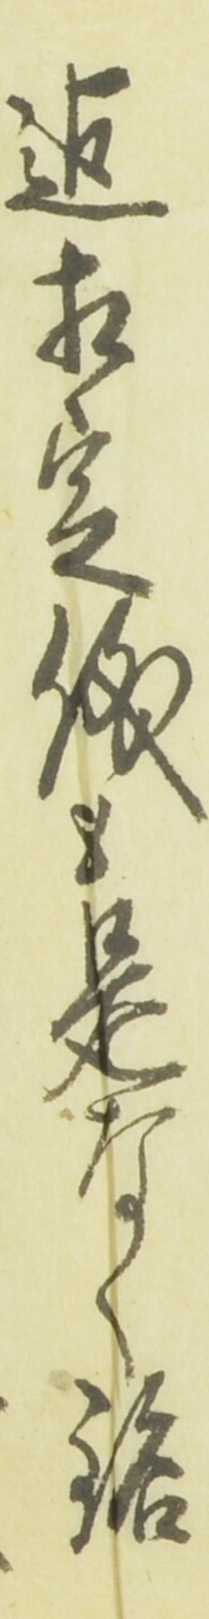迄相定儀も是なく銘
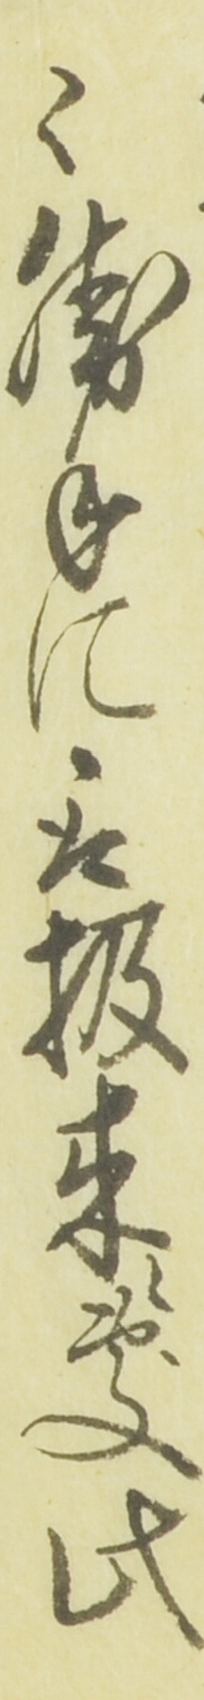々勝手に取扱来候処此
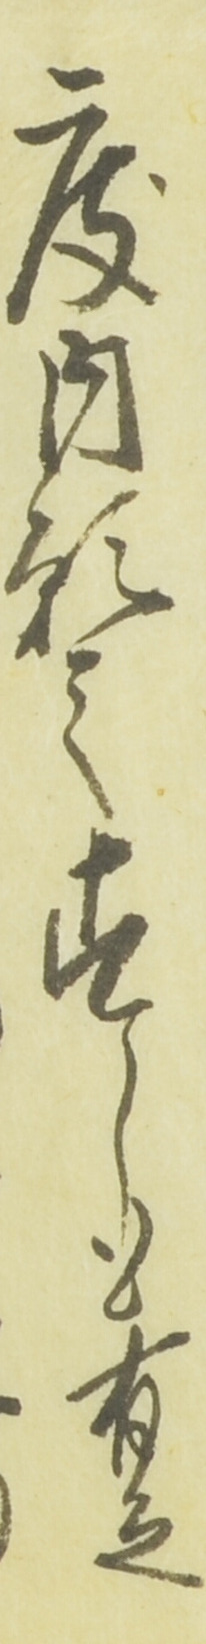度内願之すしも有之
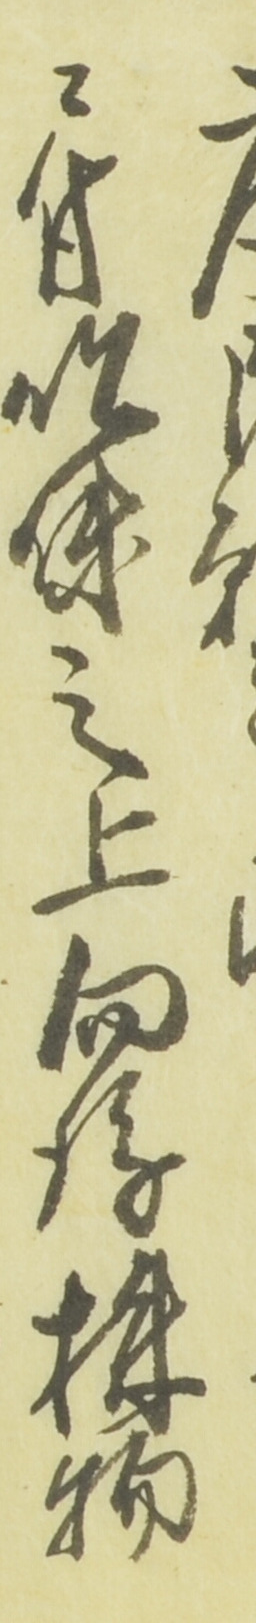ニ付吟味之上向後株物
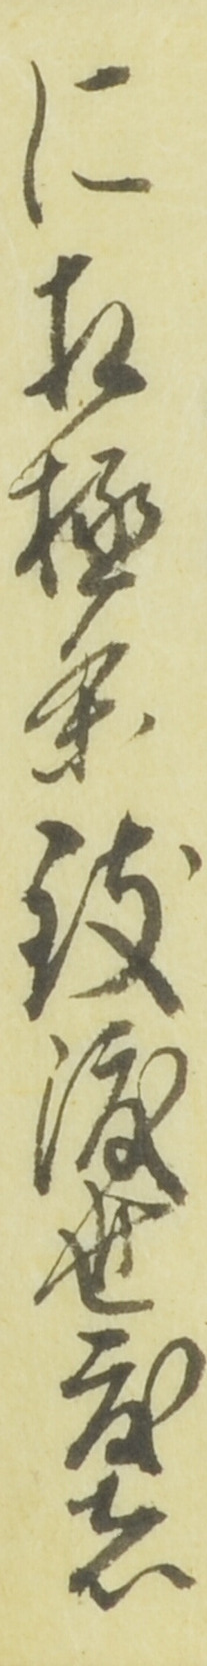に相極候条致渡世度者
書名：御触書御書附控
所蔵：伊那市立高遠町図書館・合同会社AMANE
